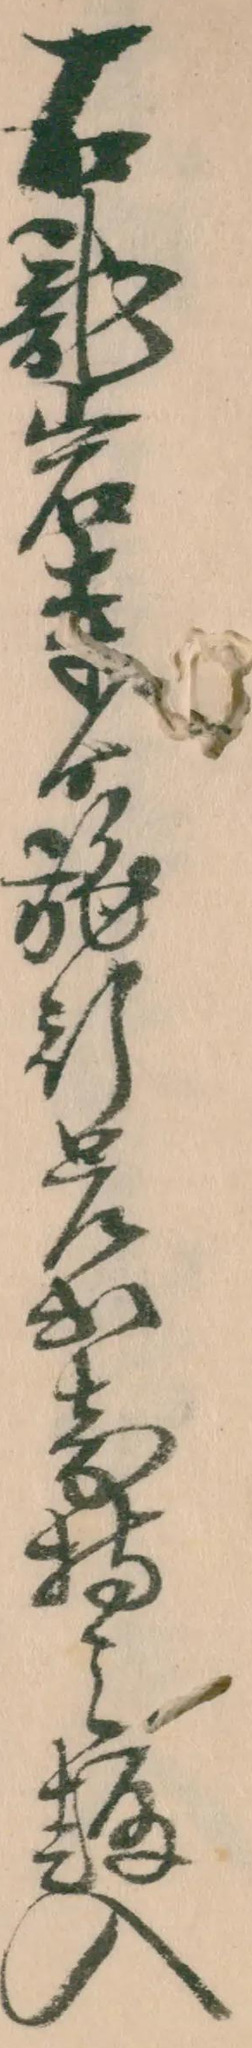右龍岩寺ゟ施行差出奇特之趣入
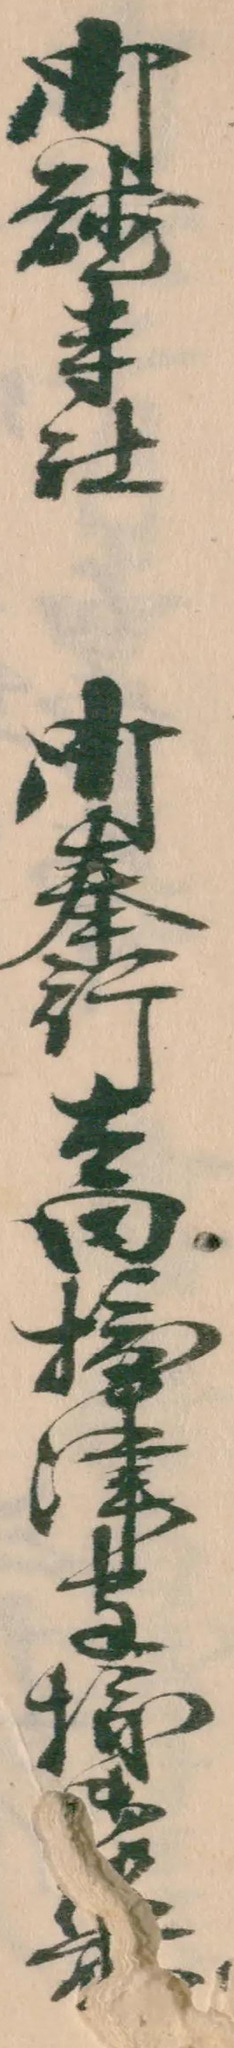御聴寺社御奉行太田摂津守様御役所
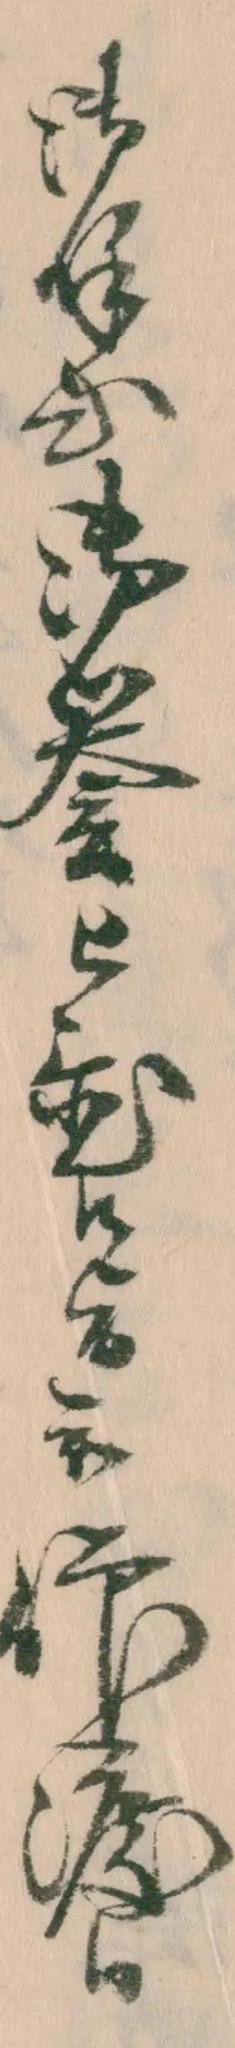御呼出御誉被置候旨被仰渡候
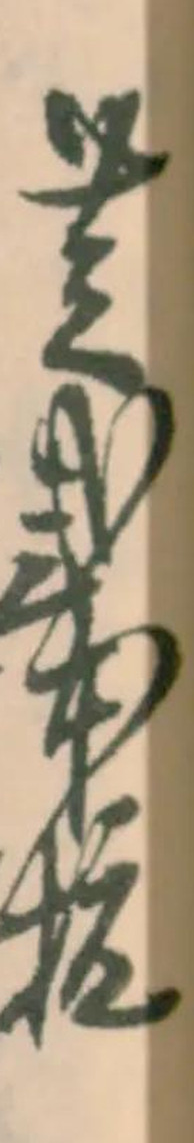芝弐本榎
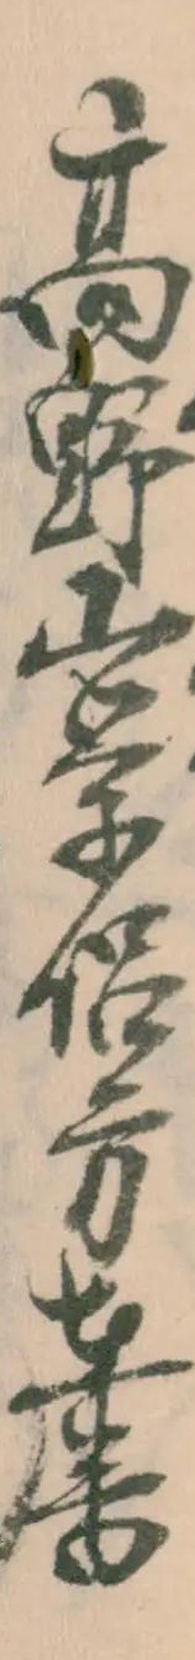高野山学侶方在番
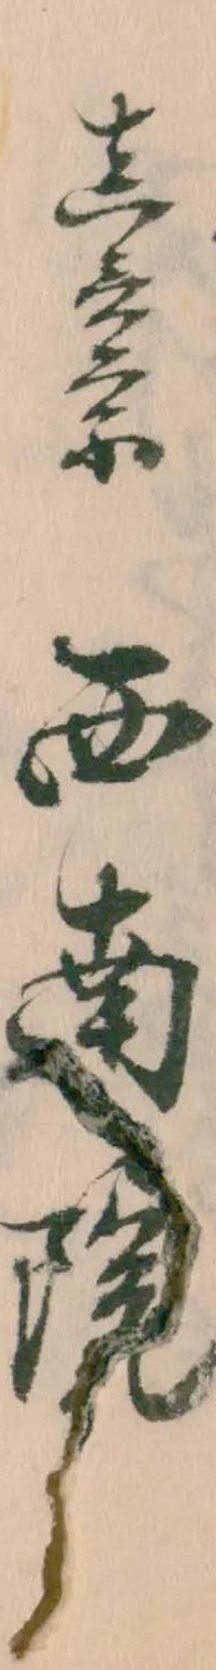真言宗西南院
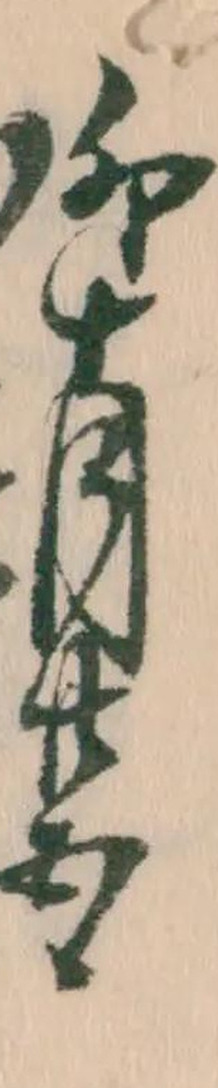卯十月廿五日
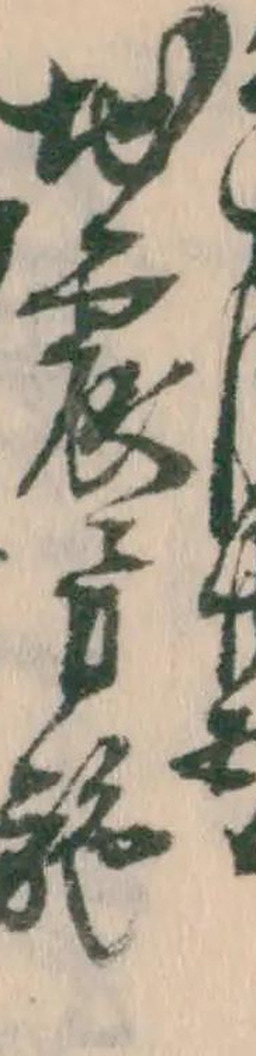地震ニ付施
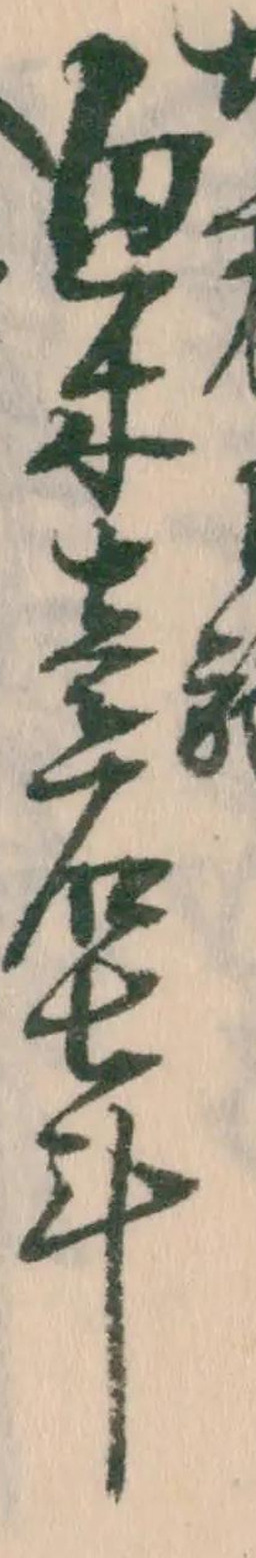一白米壱石七斗
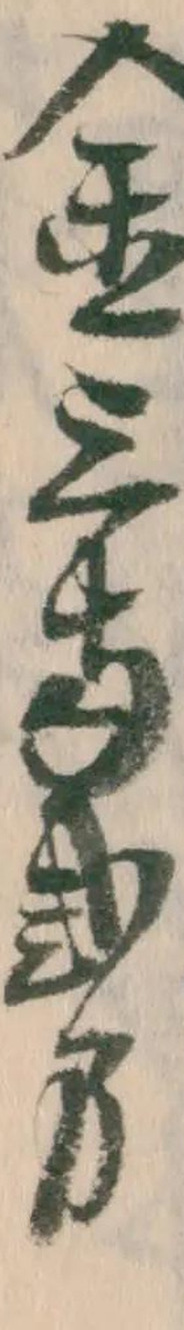金三両弐分
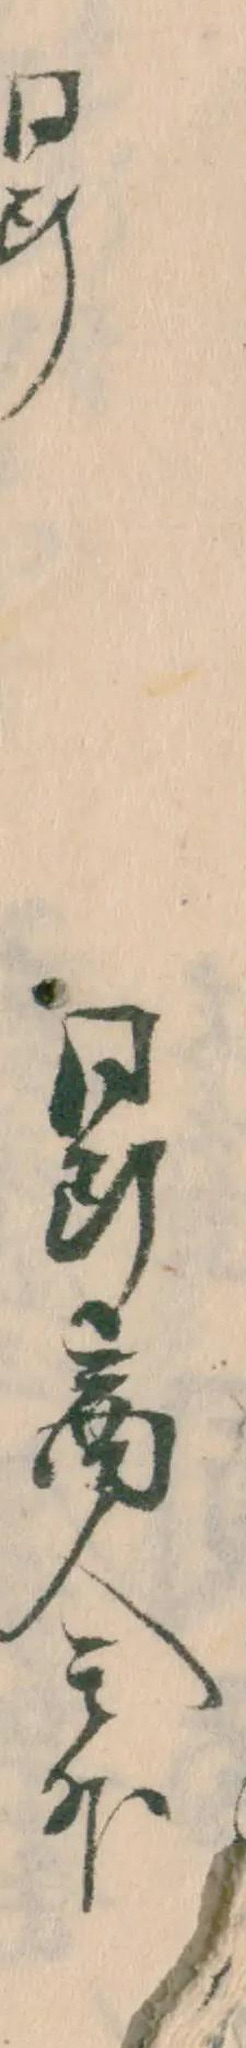同断同断商人其外
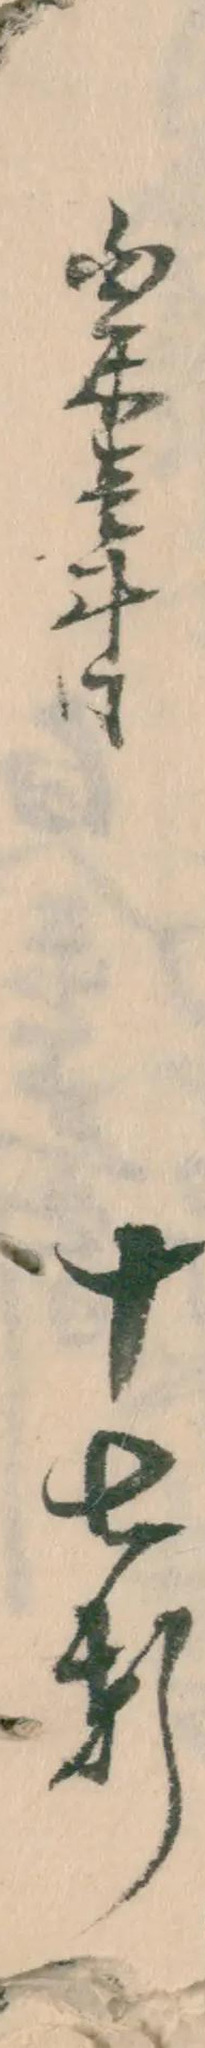白米壱斗ツヽ十七軒

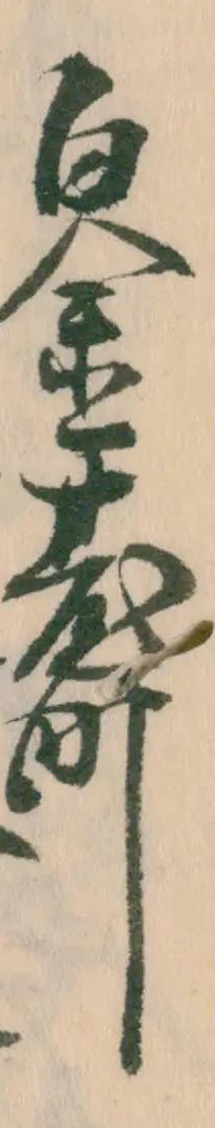白銀台町
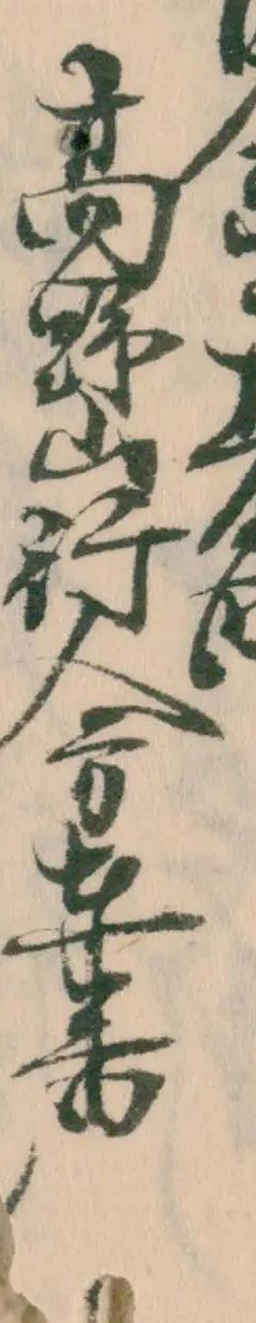高野山行人方在番
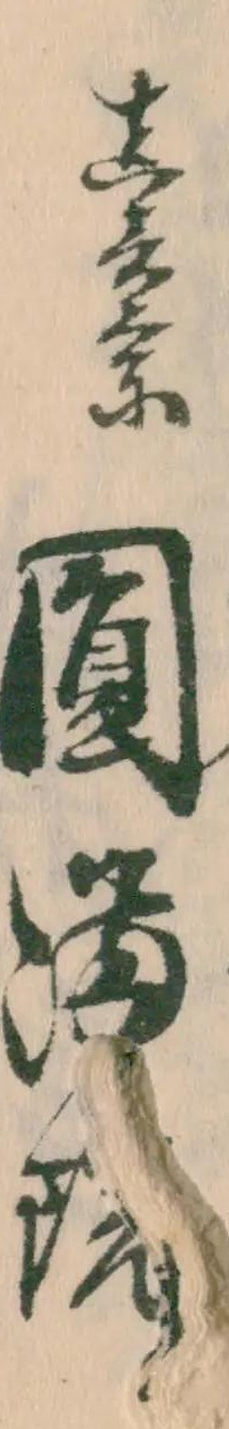真言宗円満院
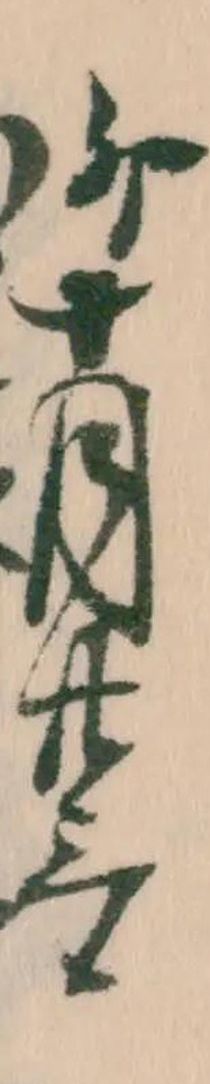卯十月廿三日
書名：武家方并寺院等ニテ施差出候一件
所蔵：国立国会図書館 National Diet Library, JAPAN
